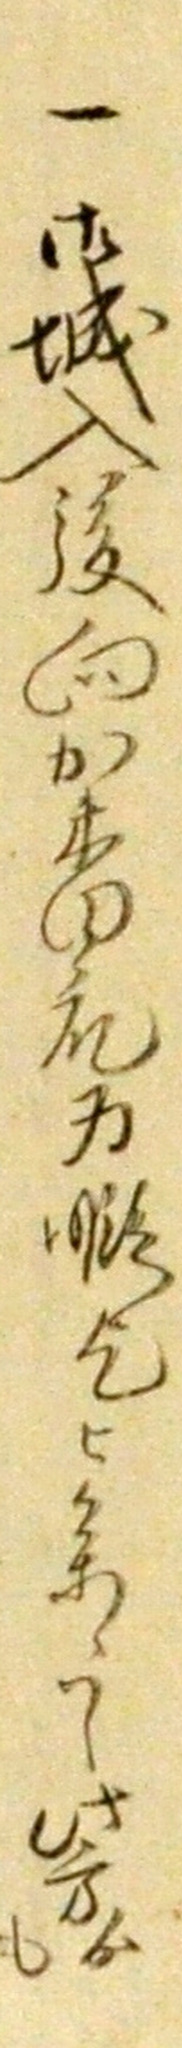一御城入後向加番衆為暇乞被参候はゝ此方ゟも
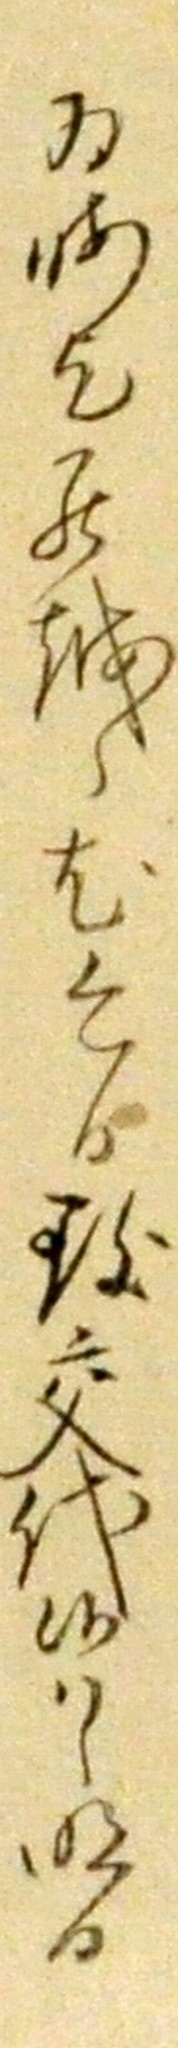為暇乞罷越候尤今日致交代候はゝ明日
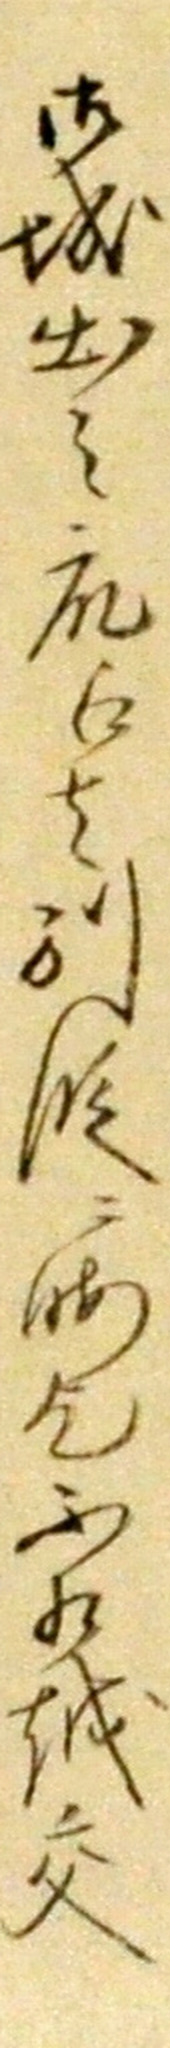御城出之衆えは別段に暇乞不相越交
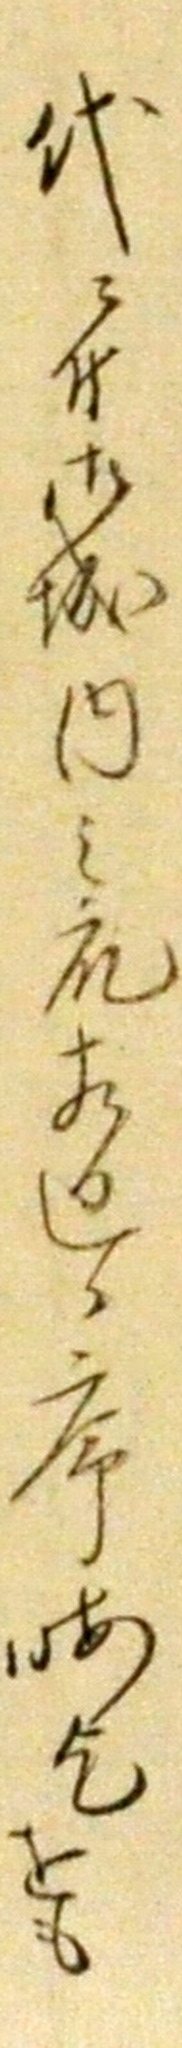代に付御城内之衆相廻候席暇乞をも
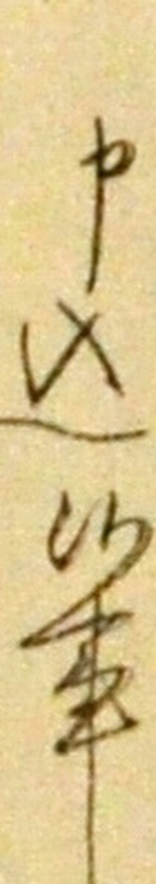申込候事
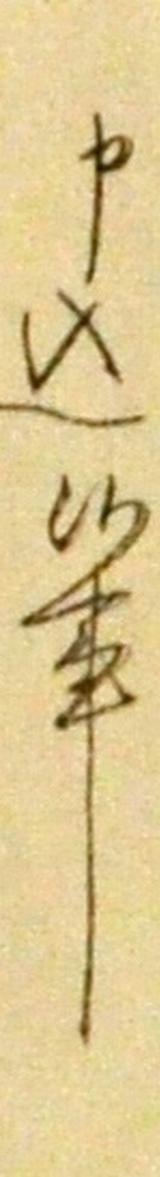申込候事
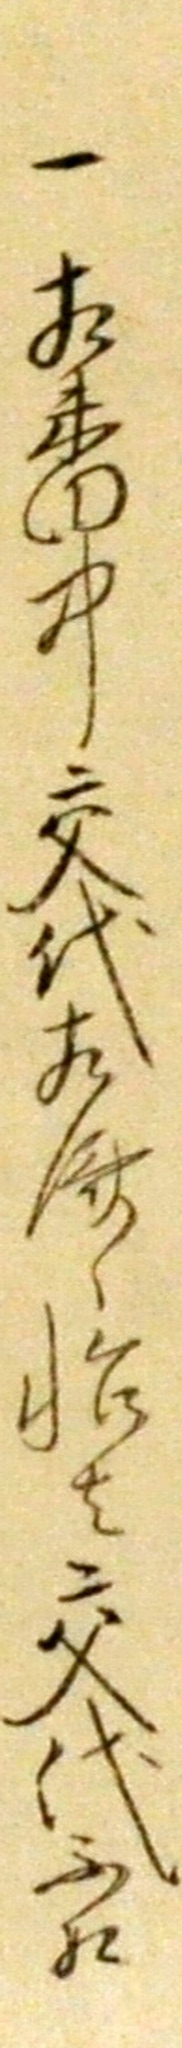一相番中交代相済候怡いは交代不相
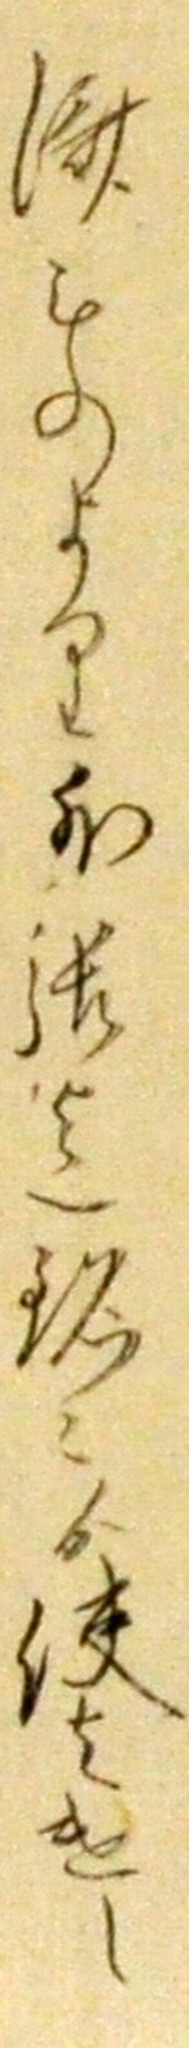済ものより外張迄銘々ゟ使者遣し
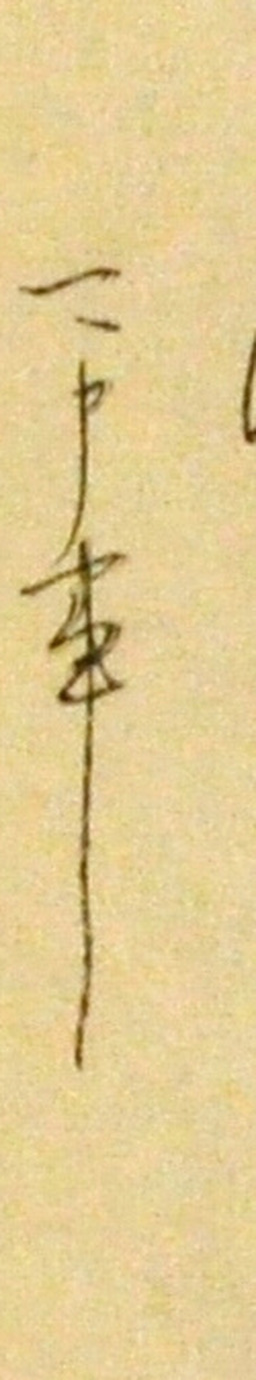可申事
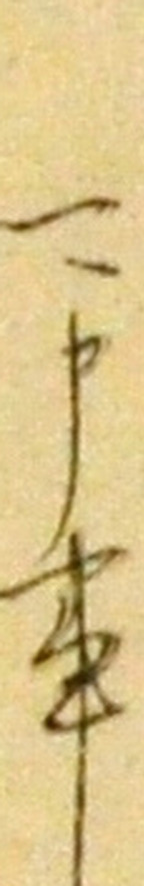可申事
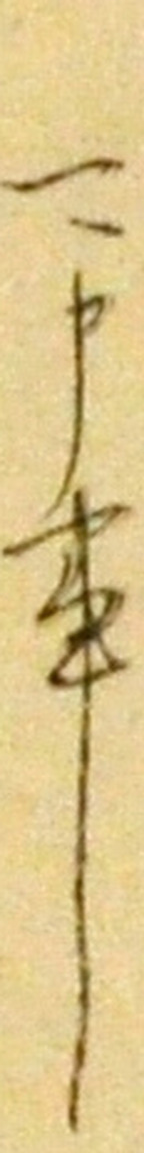可申事
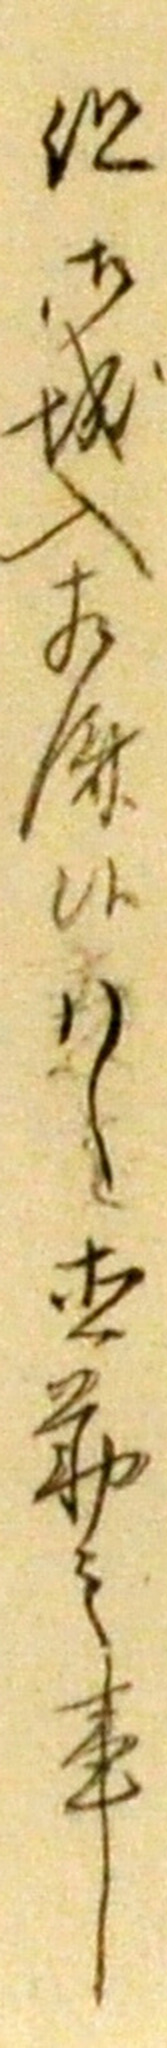但御城入相済候はゝ直勤之事
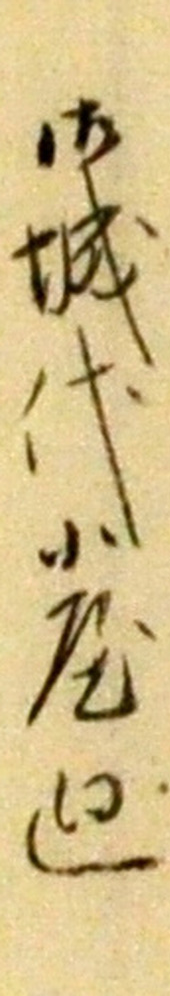御城代小屋廻
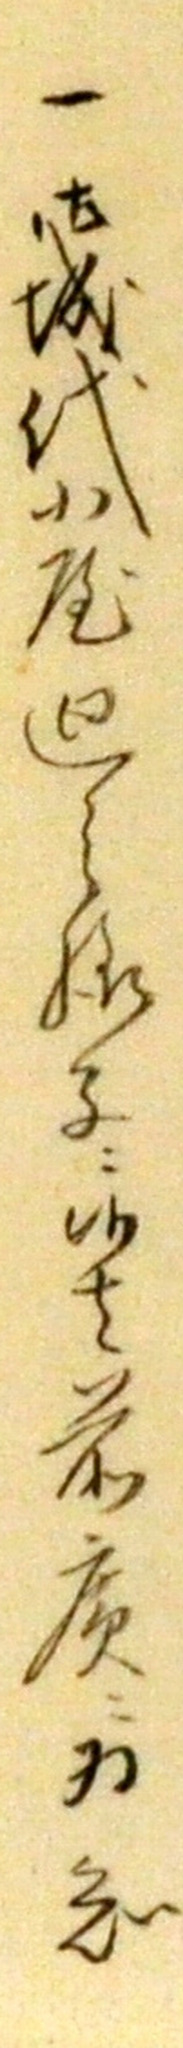一御城代小屋廻之様子に候は前広に為知
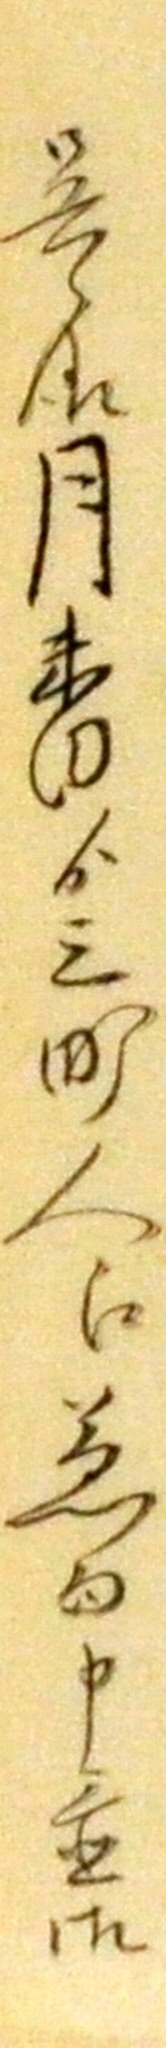呉候様月番ゟ三町人え急而申置御
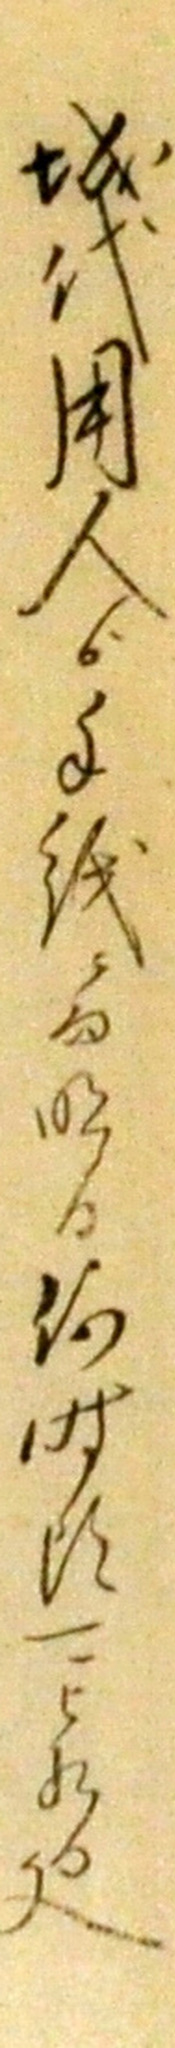城代用人ゟ手紙に而明日何時頃可被相廻
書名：大阪加番関係諸書留〔一括〕
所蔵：伊那市立高遠町図書館・合同会社AMANE
